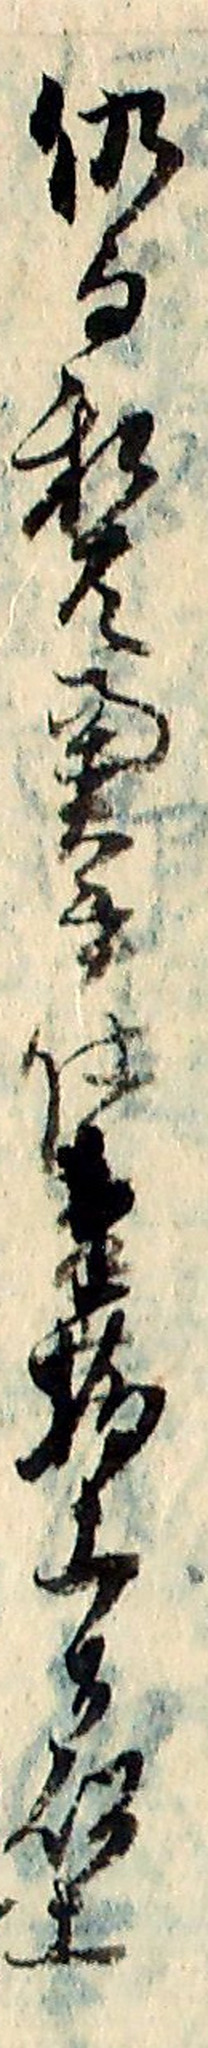仍て私共奥書仕奉指上候以上
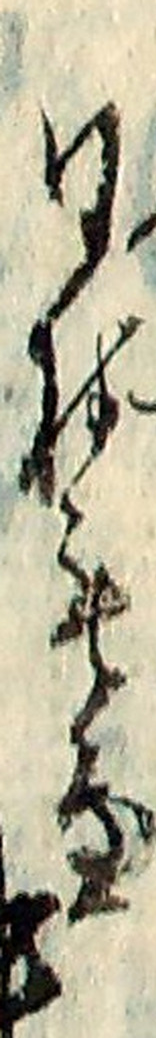同村庄屋
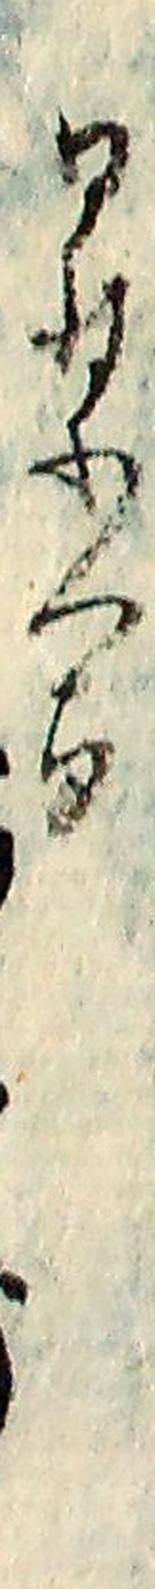同村五人与
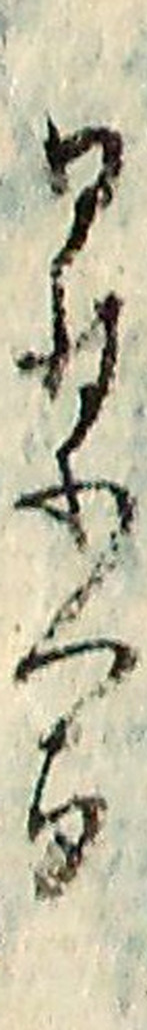同村五人与
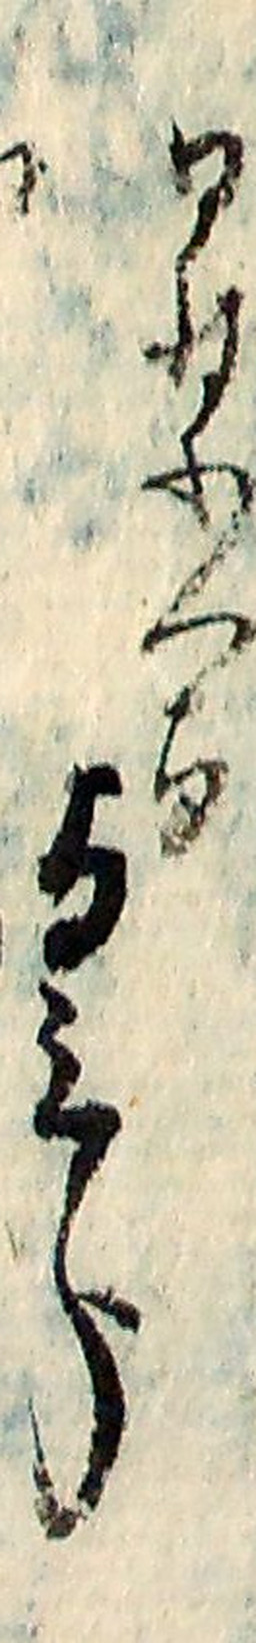与三郎
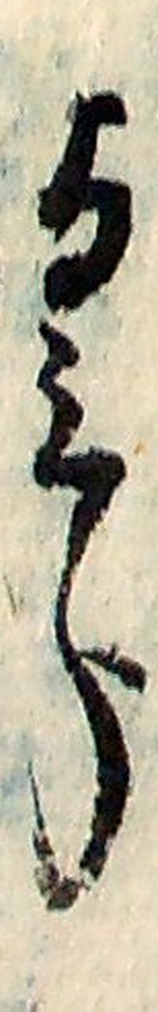与三郎

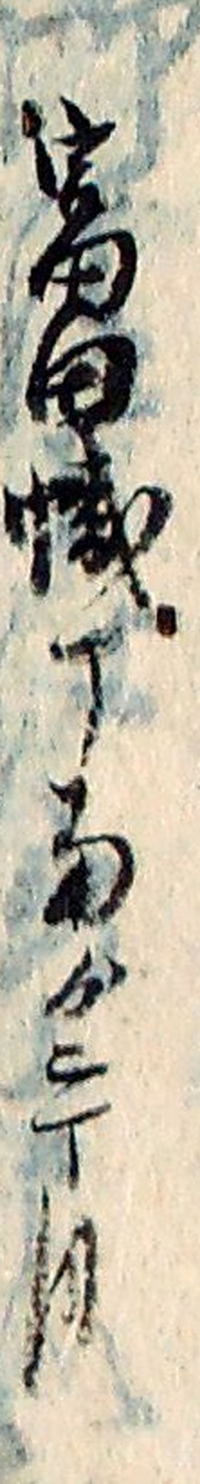富田幟丁南ゟ二丁目
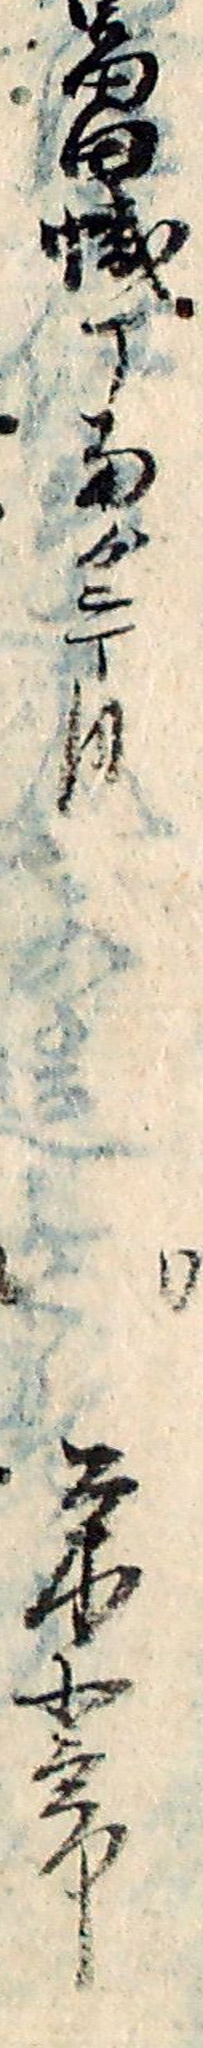富田幟丁南ゟ二丁目
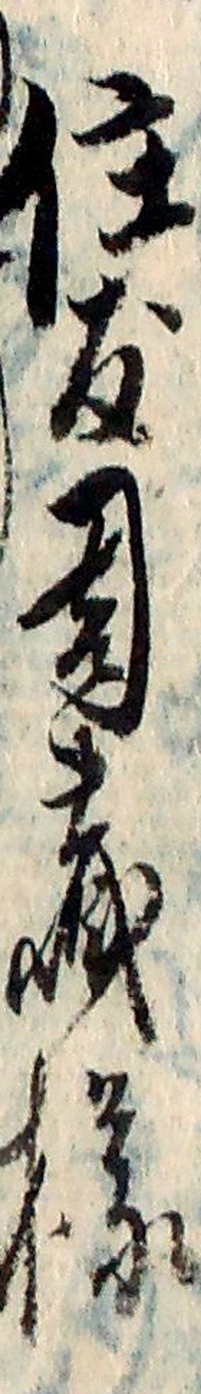住友周蔵様
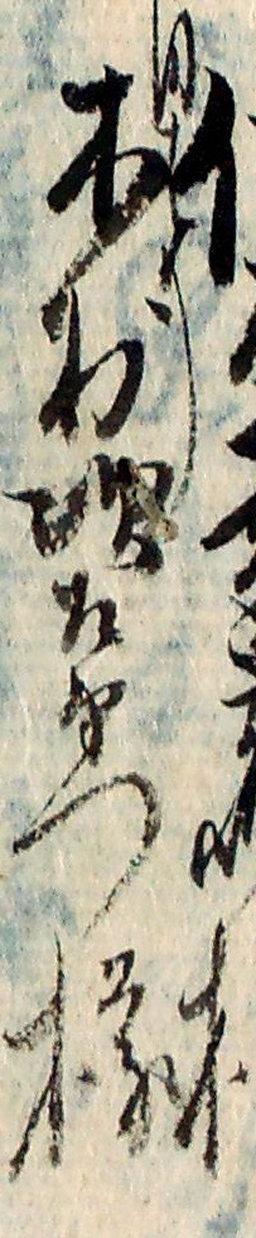木村次左衛門様
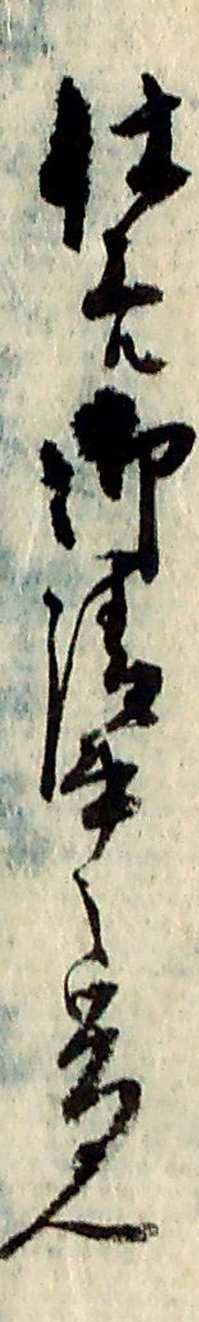仕上る御請書之覚
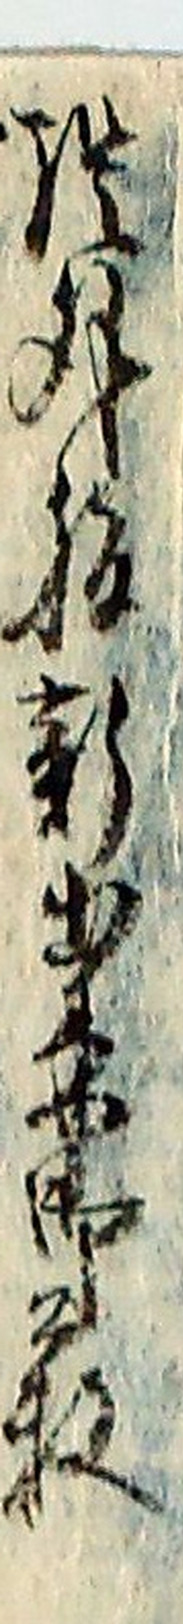堤外腹新出来御藪
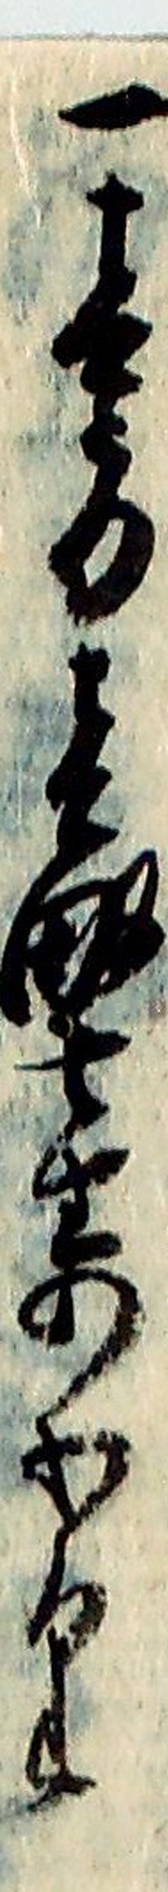一壱方壱畝七歩五厘
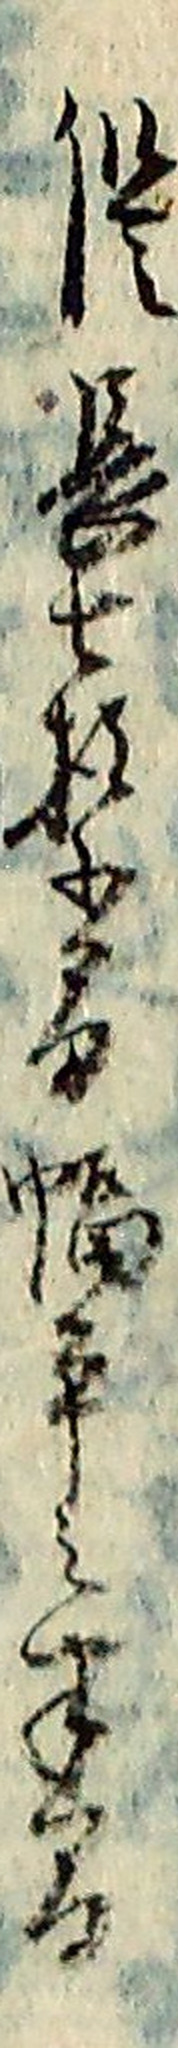但し長七拾五間幅平し半間
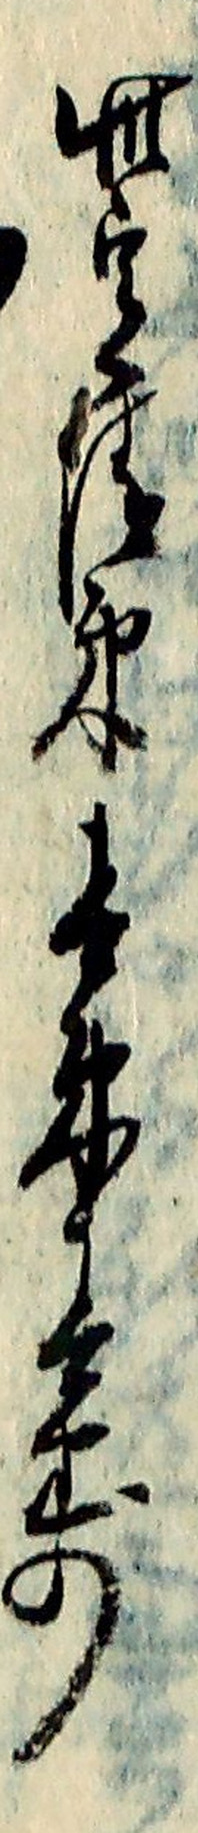此定請束壱束壱歩
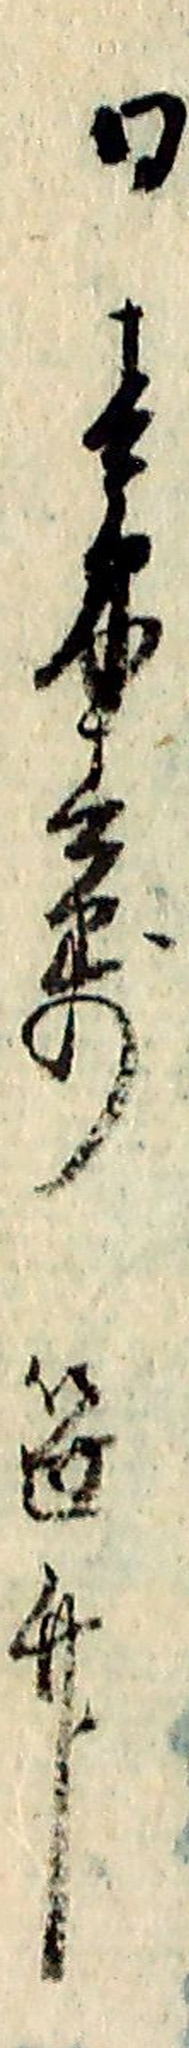内壱束壱歩笹竹
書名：諸御願書控(後藤氏壱番）
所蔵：鳴門教育大学 Naruto University of Education
